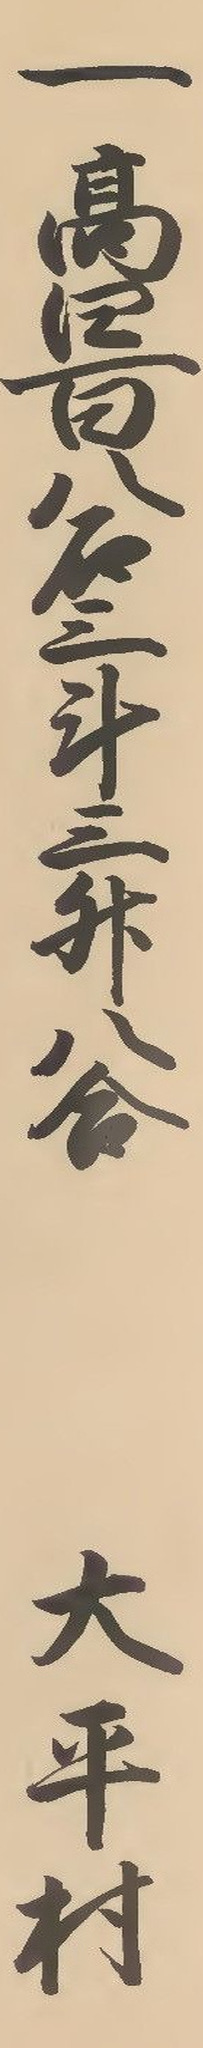一高四百八石三斗三升八合大平村
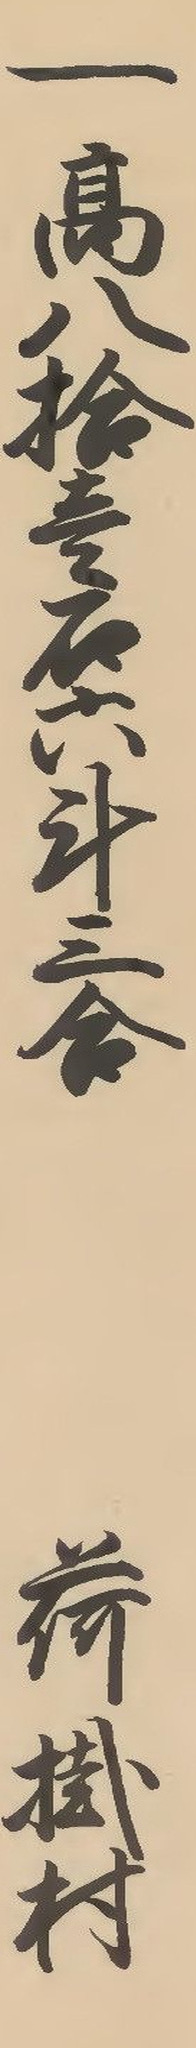一高八拾壱石六斗三合荷掛村
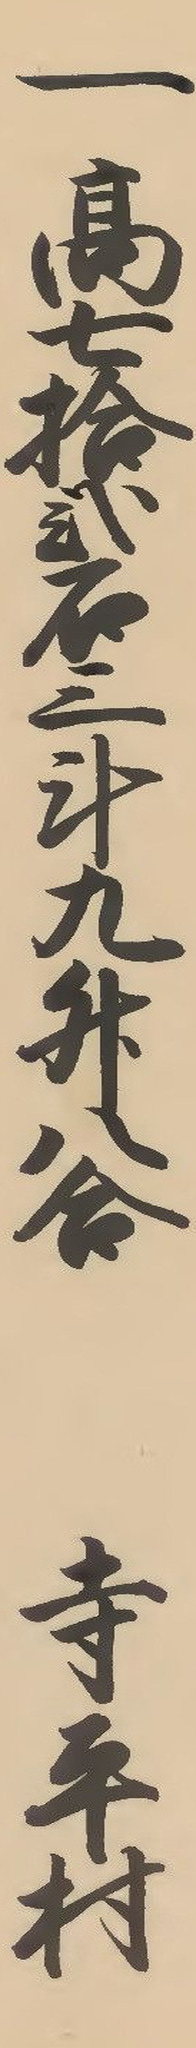一高七拾弐石三斗九升八合寺平村
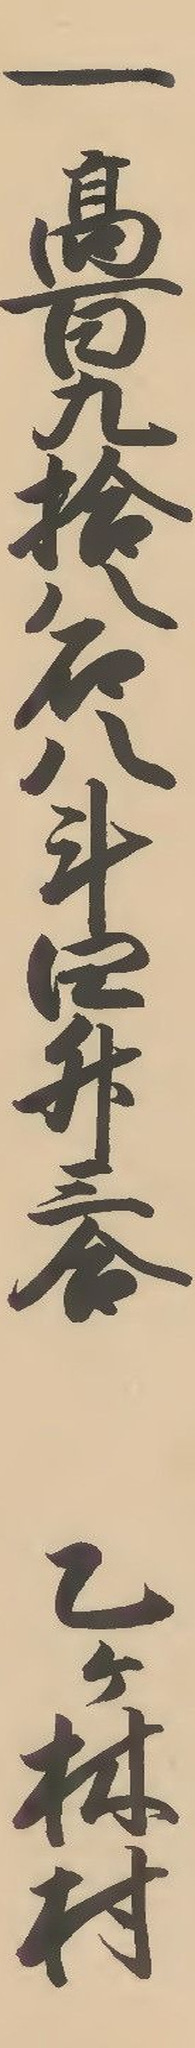一高百九拾八石八斗四升三合乙ヶ林村

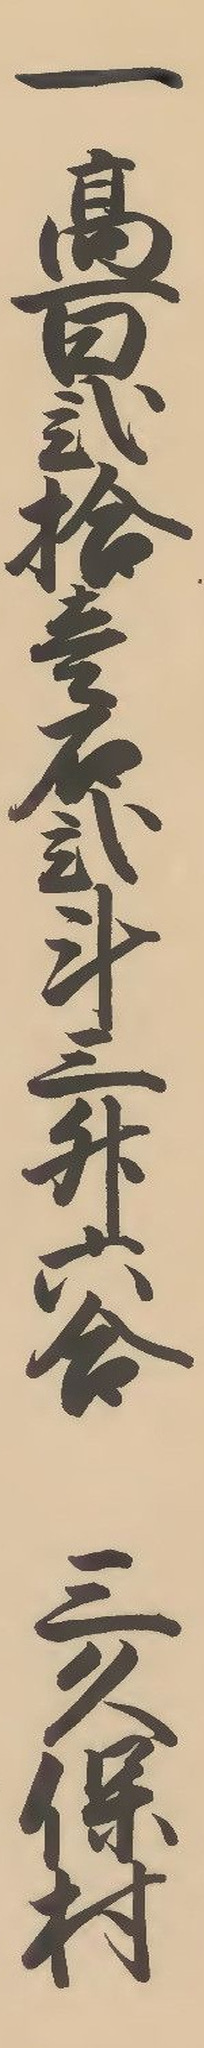一高百弐拾壱石弐斗三升六合三久保村
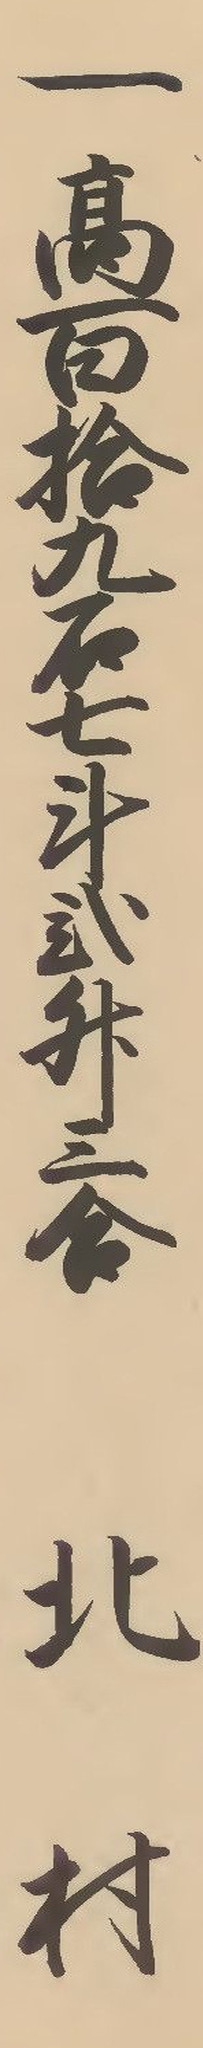一高百拾九石七斗弐升三合北村
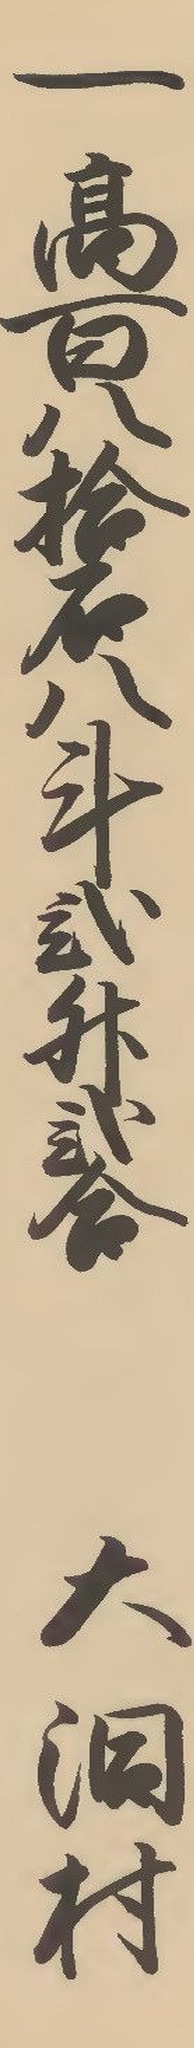一高百八拾石八斗弐升弐合大洞村
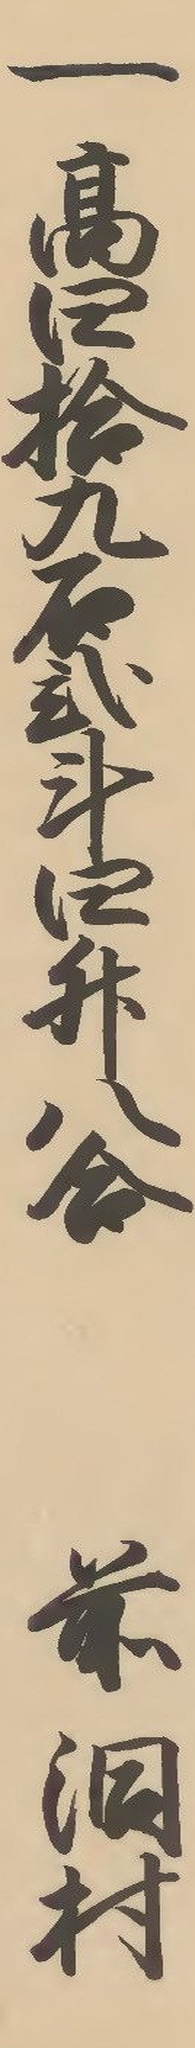一高四拾九石弐斗四升八合前洞村
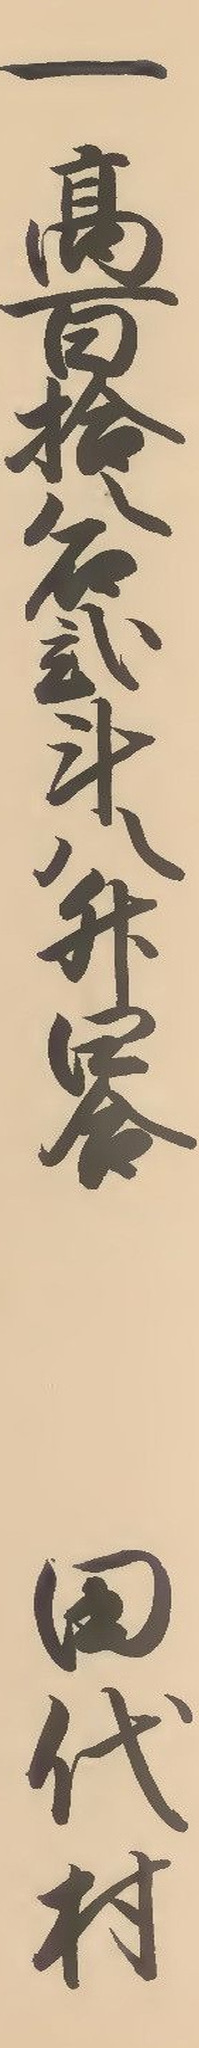一高百拾八石弐斗八升四合田代村
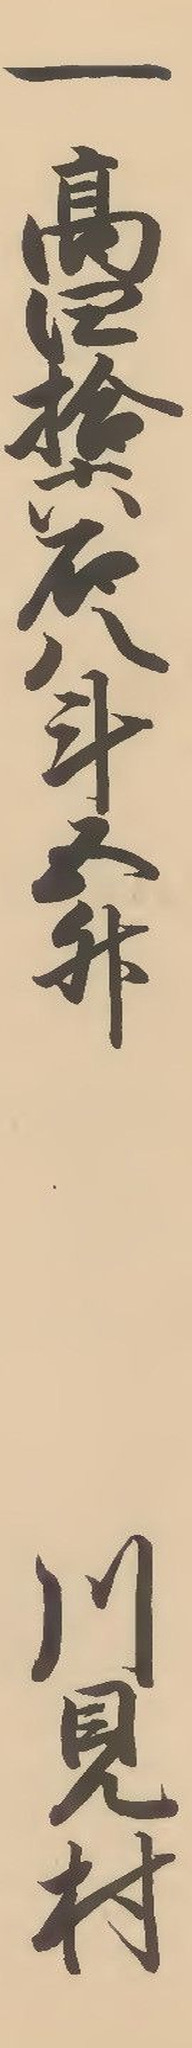一高四拾六石八斗五升川見村
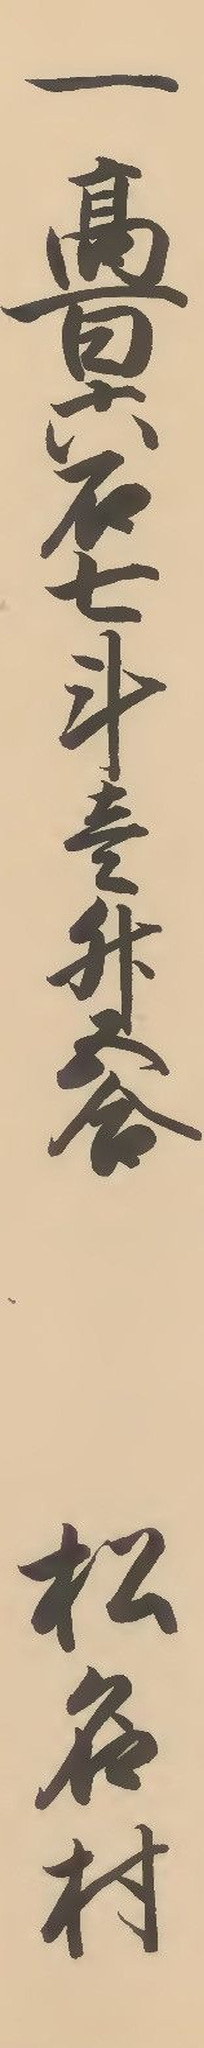一高百六石七斗壱升五合松名村
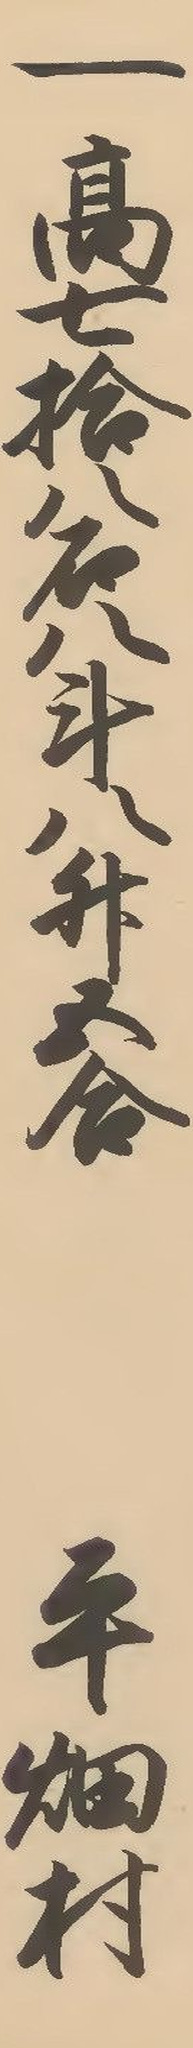一高七拾八石八斗八升五合平畑村

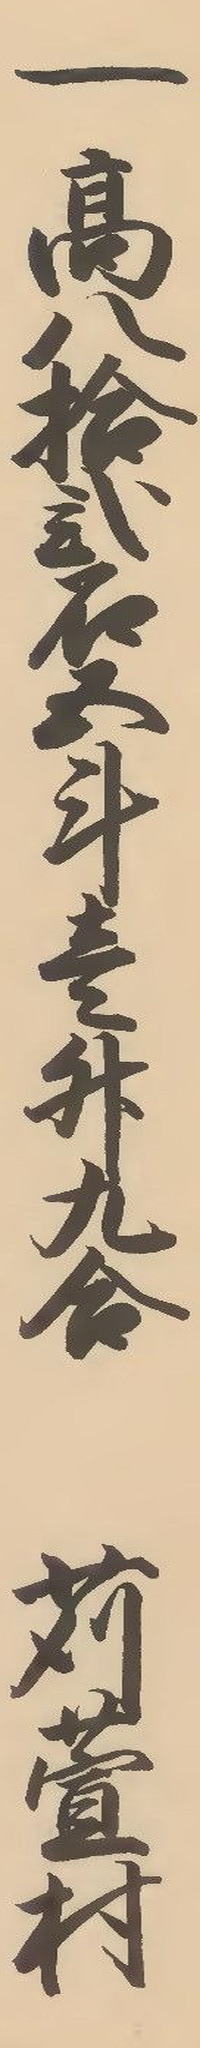一高八拾弐石五斗壱升九合苅萱村
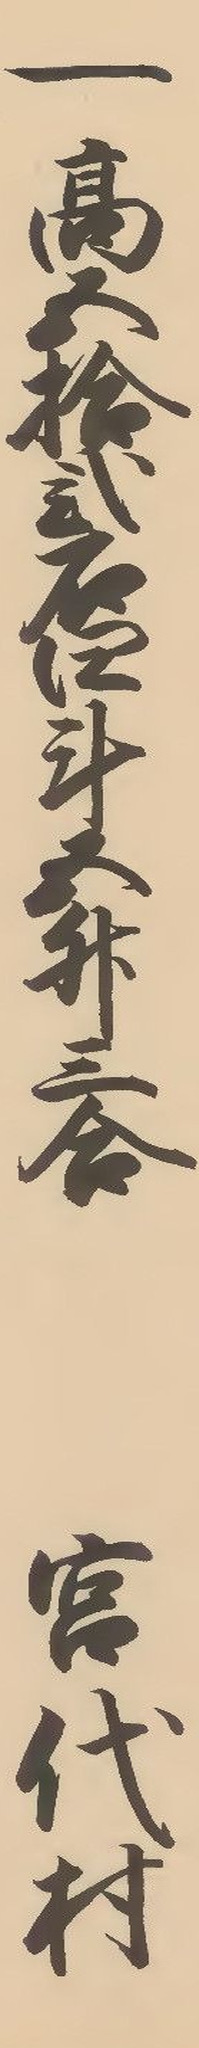一高五拾弐石四斗五升三合宮代村
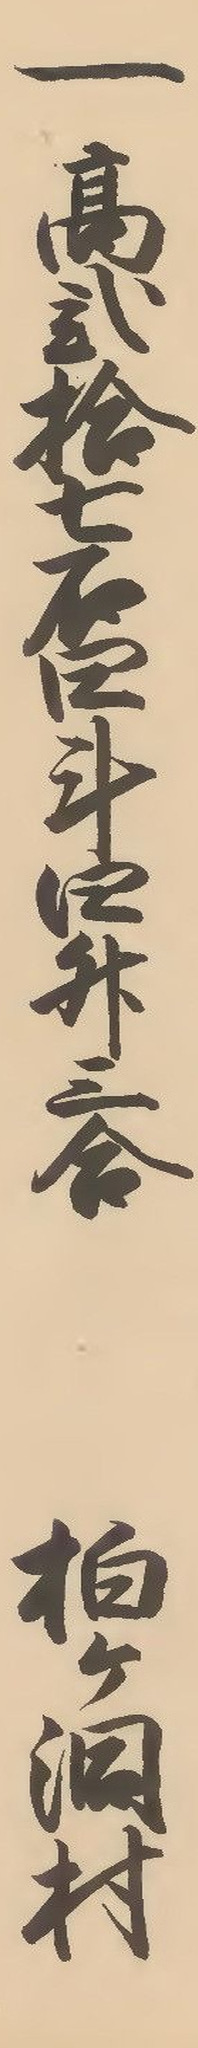一高弐拾七石四斗四升三合柏ヶ洞村
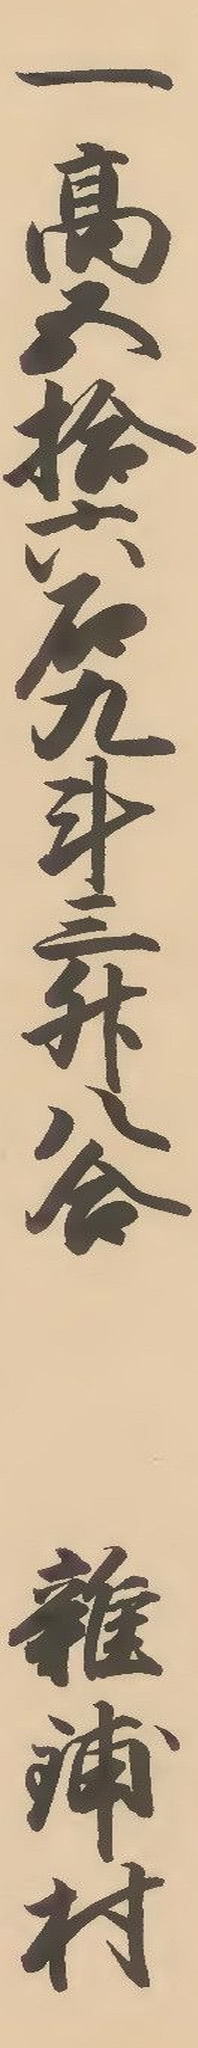一高五拾六石九斗三升八合雑鋪村
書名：三河国郷帳
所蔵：国立公文書館 National Archives of Japan
